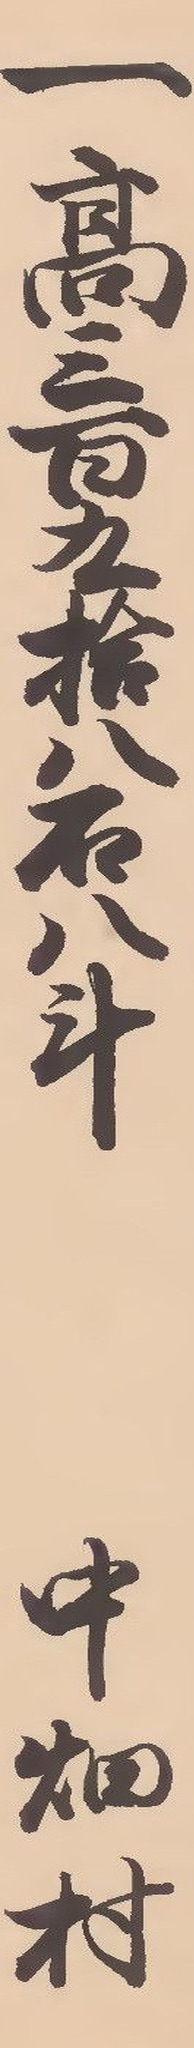一高三百九拾八石八斗中畑村
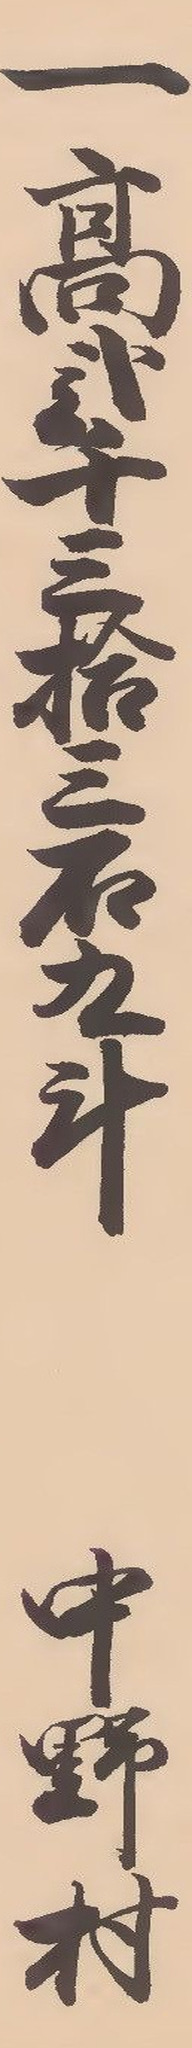一高弐千三拾三石九斗中野村
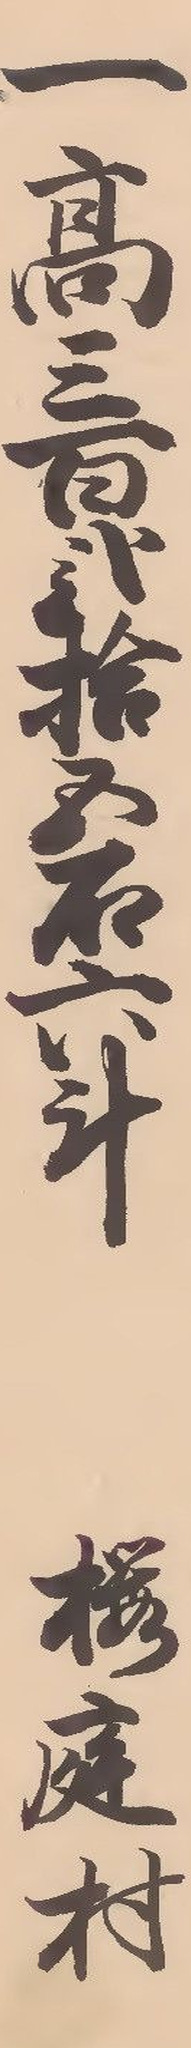一高三百弐拾五石六斗桜庭村

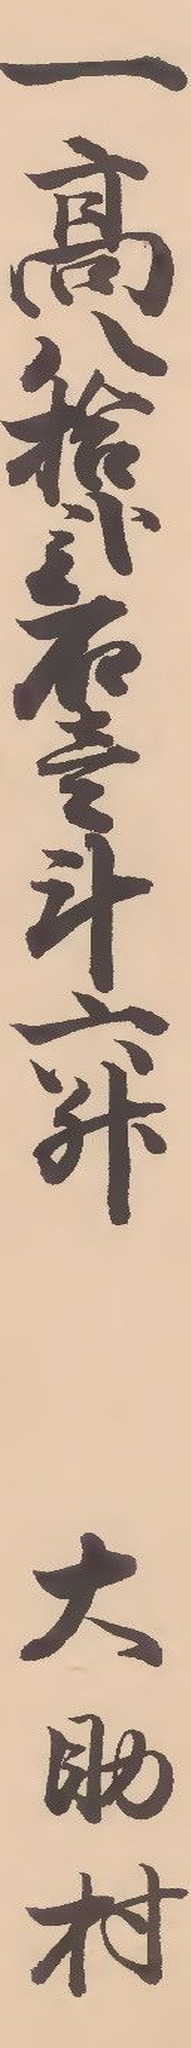一高八拾弐石壱斗六升大助村
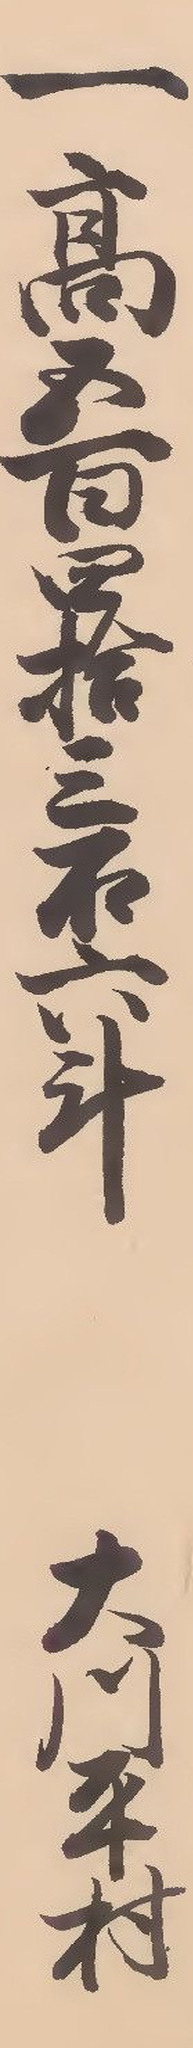一高五百四拾三石六斗大川平村
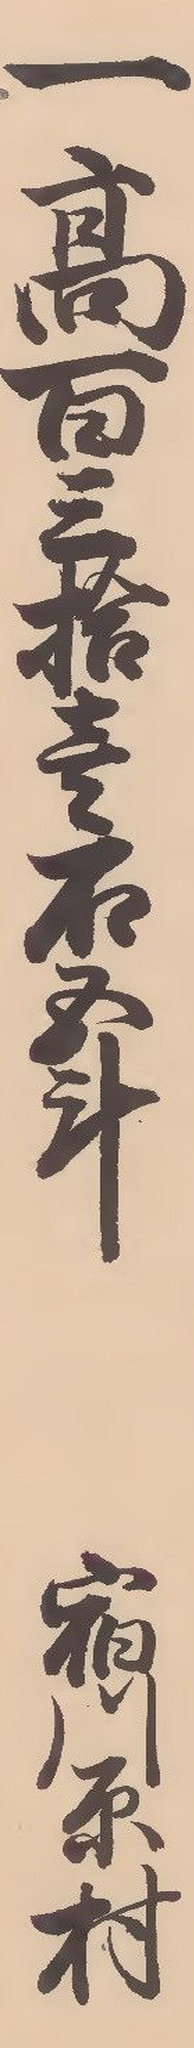一高百三拾壱石五斗宿川原村

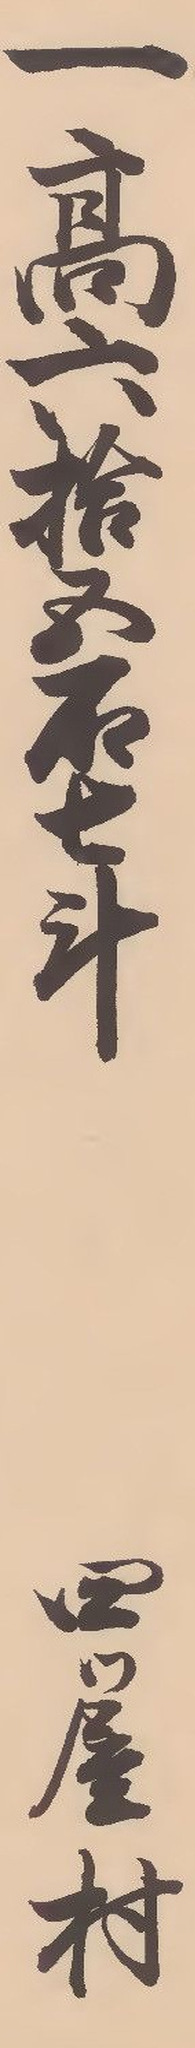一高六拾五石七斗四ツ屋村
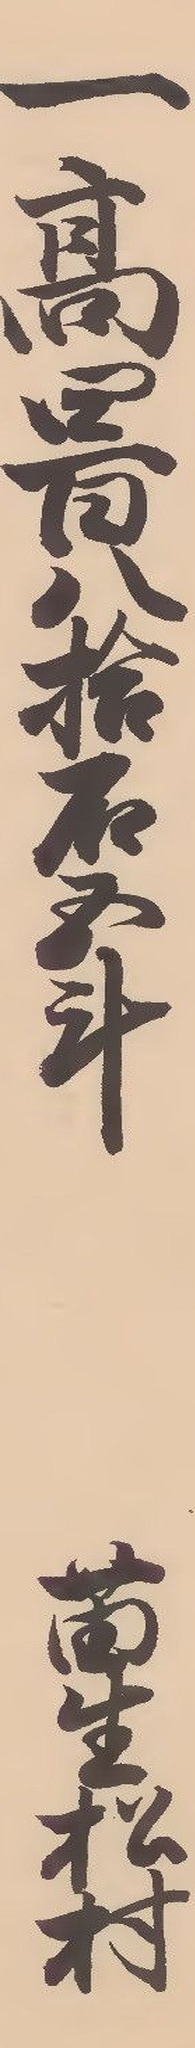一高四百八拾石五斗苗生松村
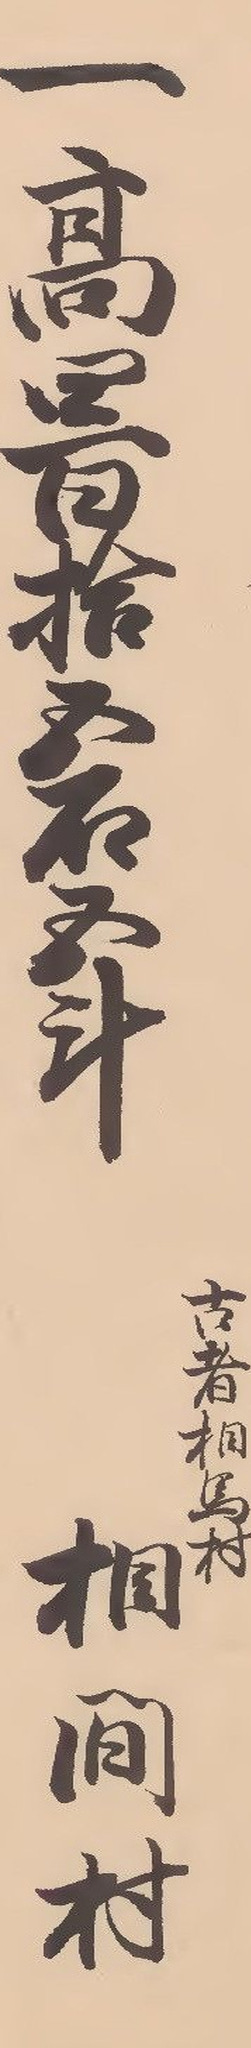一高四百拾五石五斗相間村
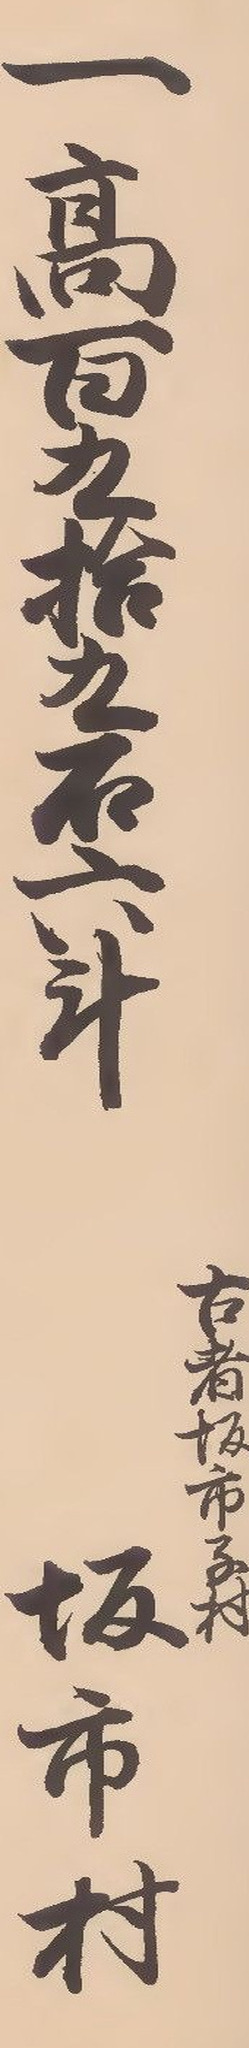一高百九拾九石六斗坂市村
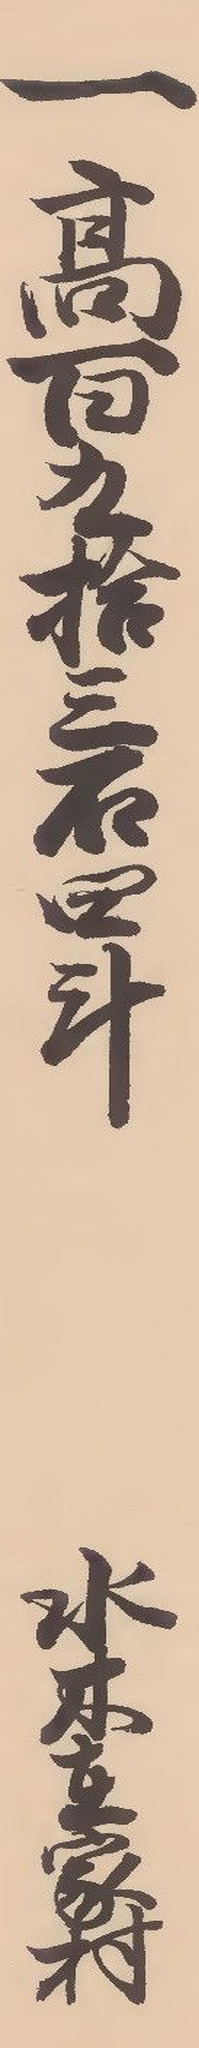一高百九拾三石四斗水木在家村
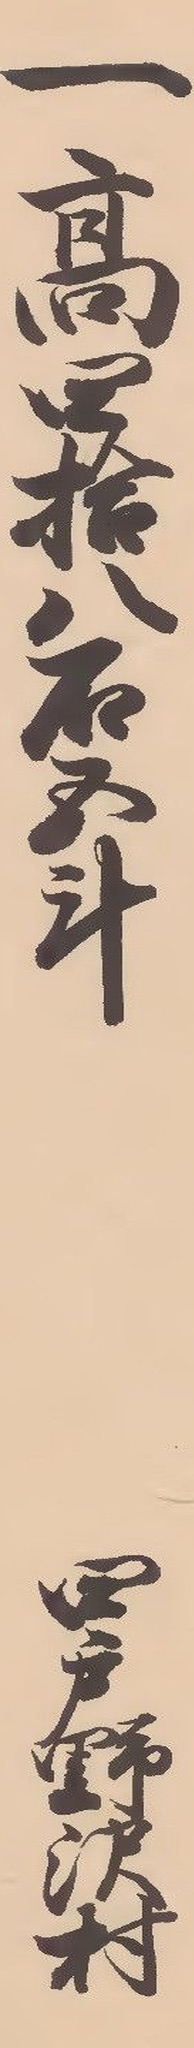一高四拾八石五斗四戸野沢村
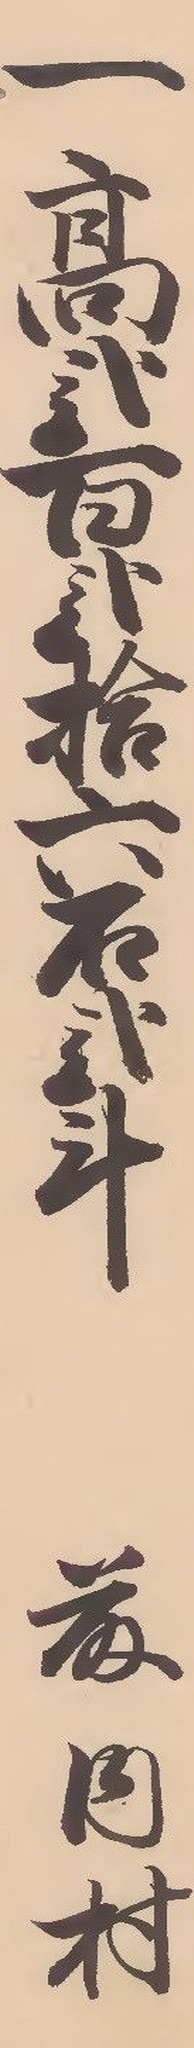一高弐百弐拾六石弐斗藤内村

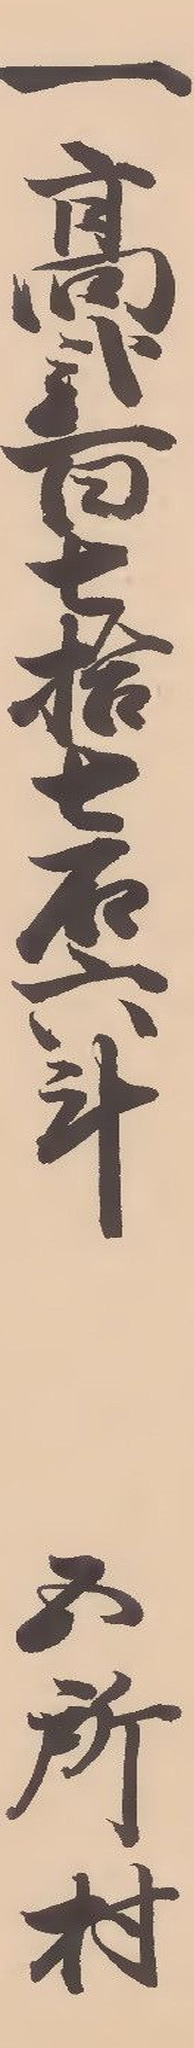一高弐百七拾七石六斗五所村
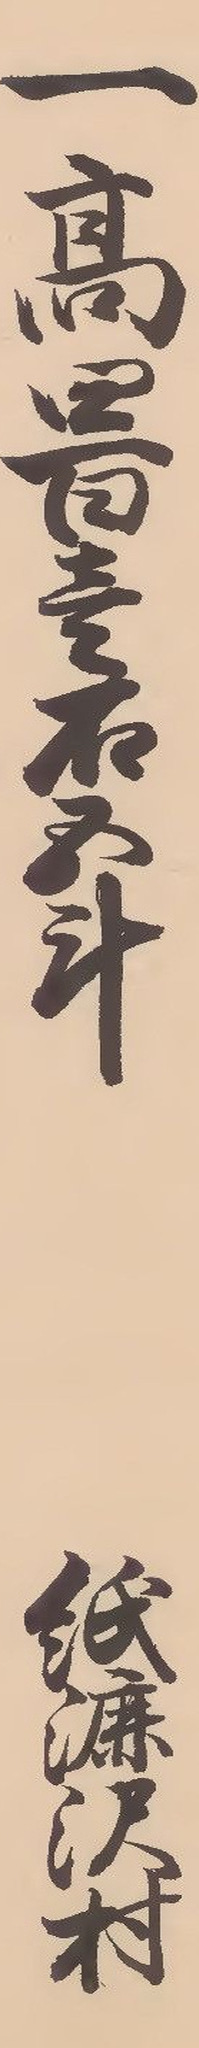一高四百壱石五斗紙漉沢村
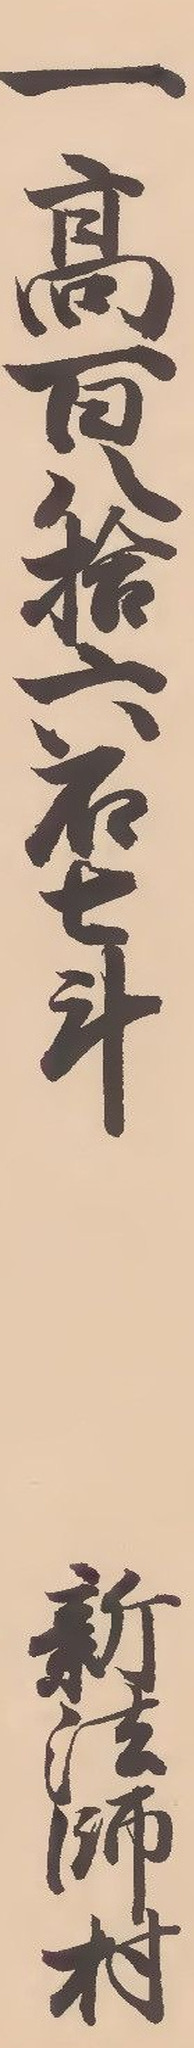一高百八拾六石七斗新法師村
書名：陸奥国郷帳　７
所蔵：国立公文書館 National Archives of Japan
